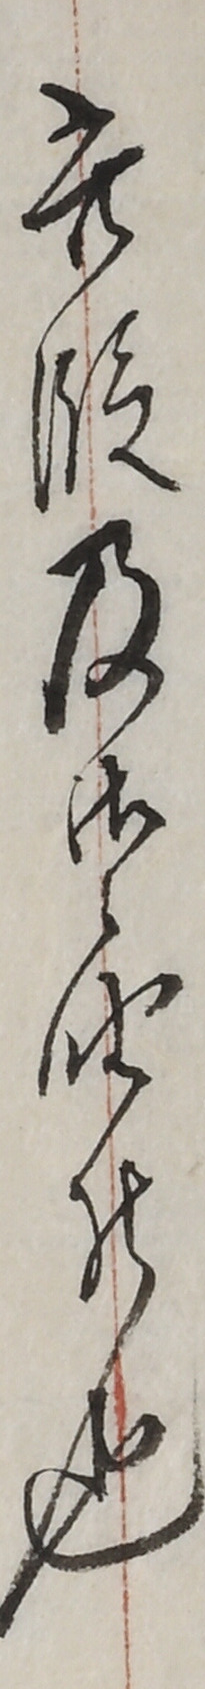此段及御届候也
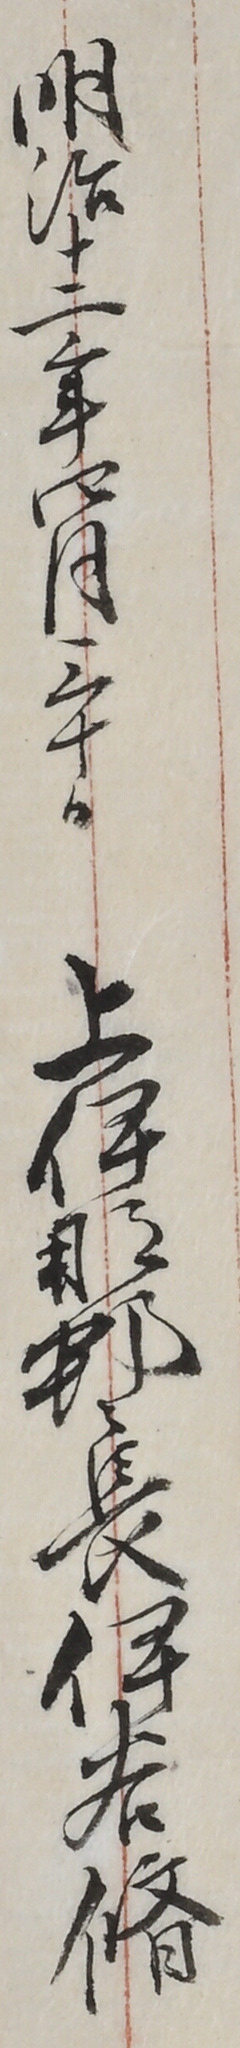明治十二年四月三十日上伊那郡之長伊谷脩
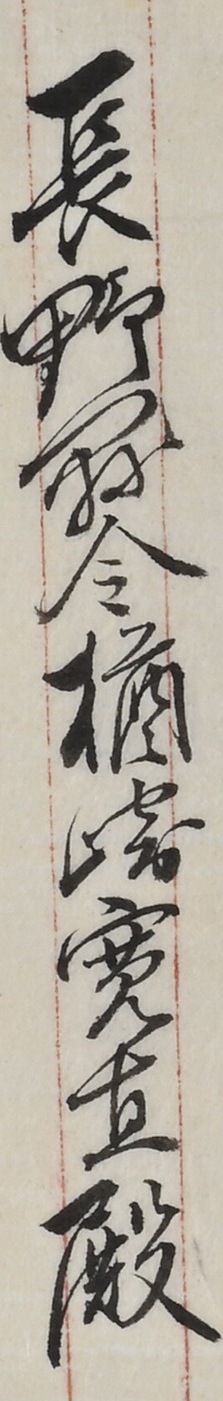長野県令楢崎寛直殿

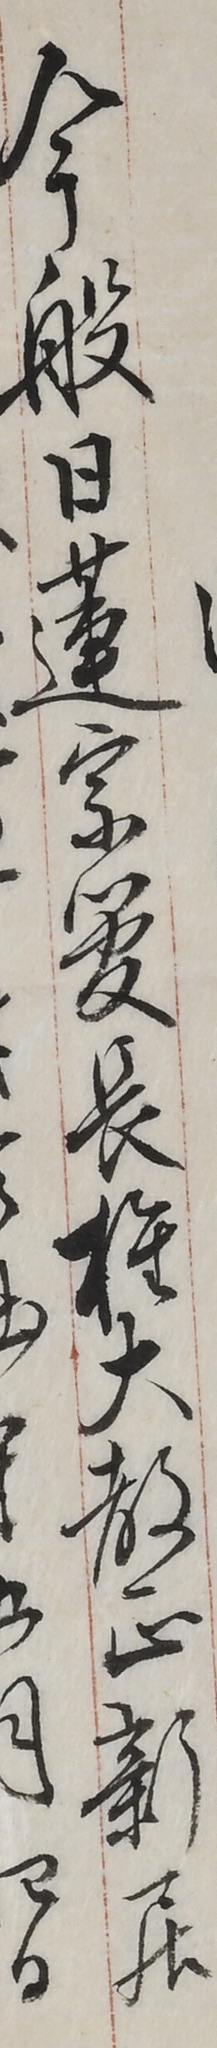今般日蓮宗管長権大教正新居
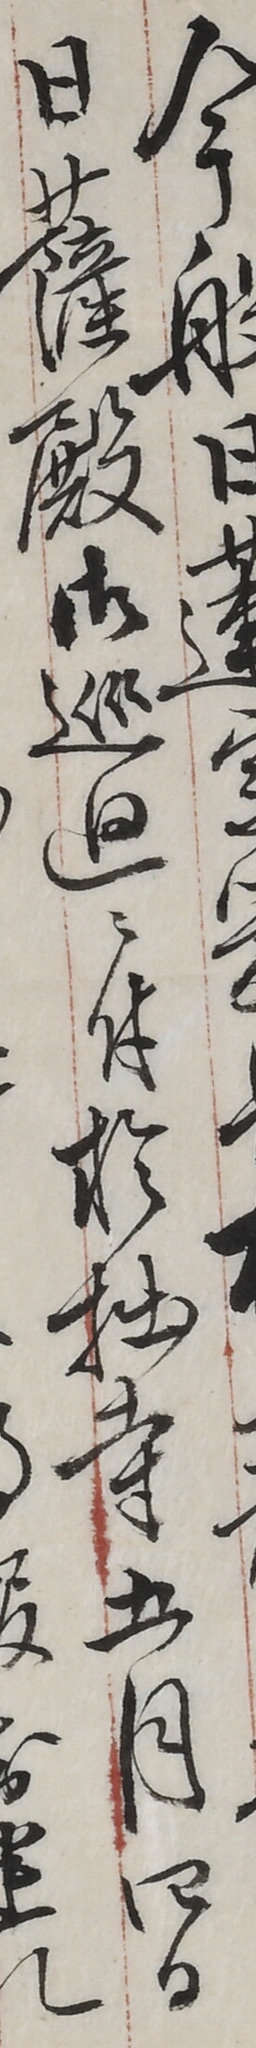日薩殿御巡廻に付於拙寺五月四日
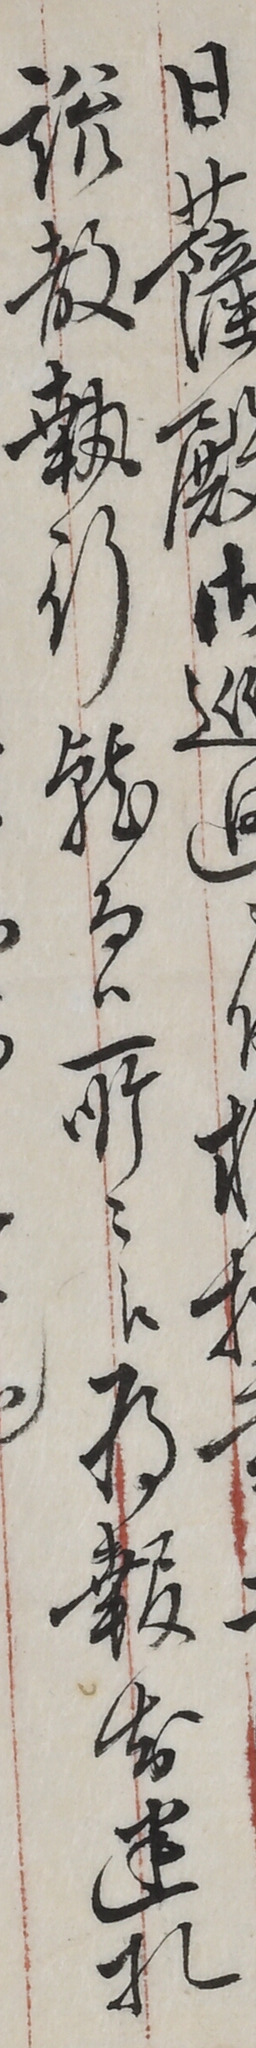説教執行就而ハ所々江為報知建札
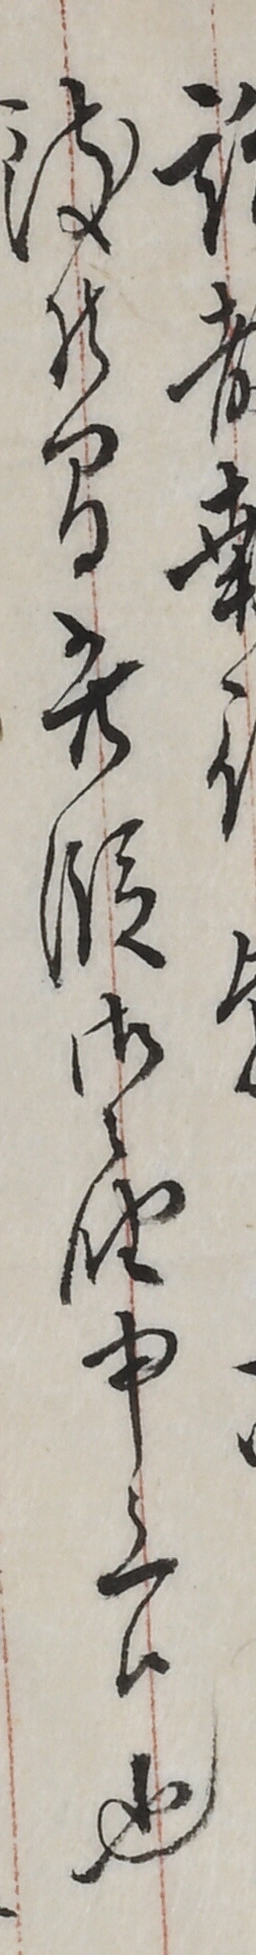致候間此段御届申上候也
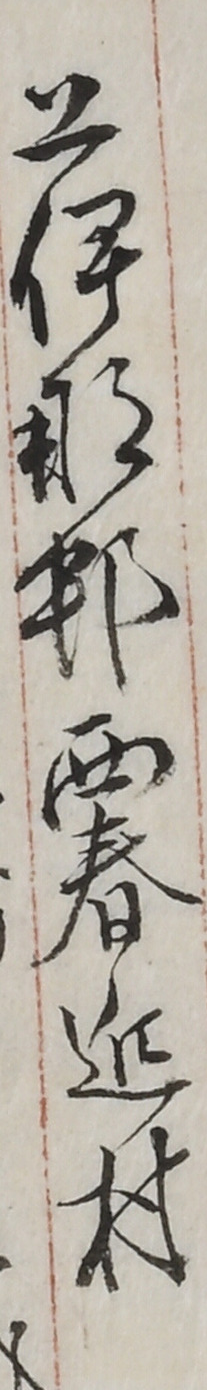上伊那郡西春近村
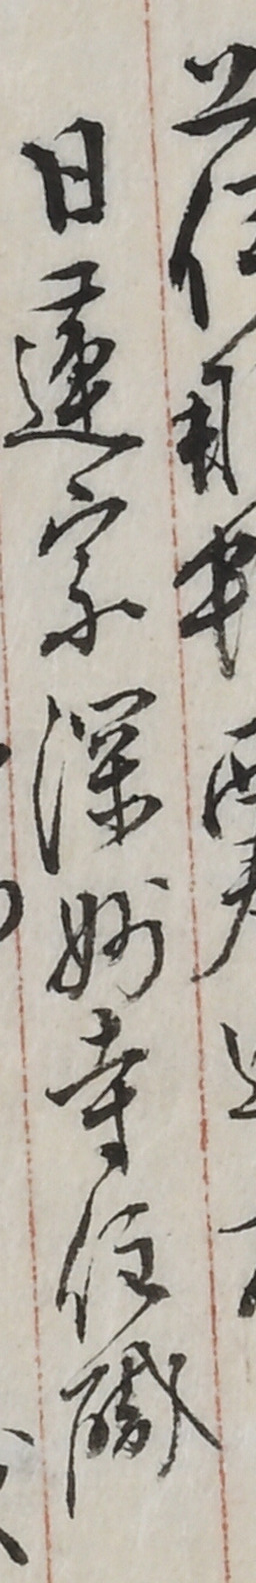日蓮宗深妙寺住職
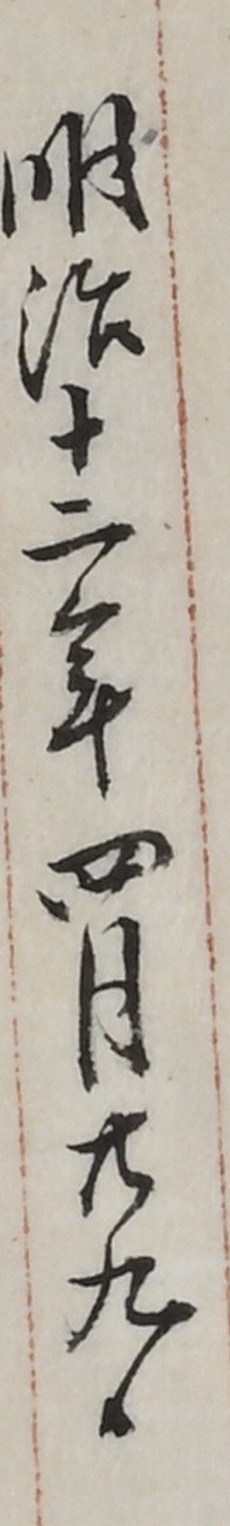明治十二年四月廿九日
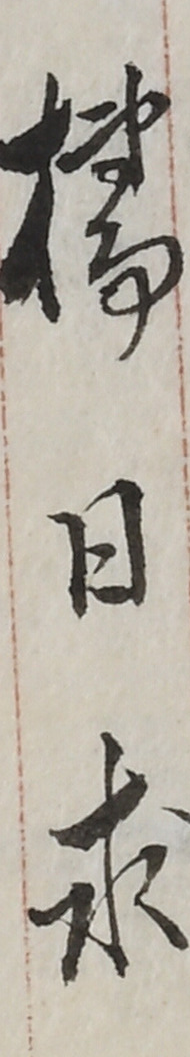橘日求
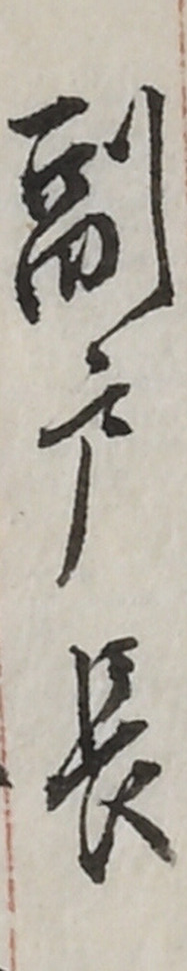副戸長
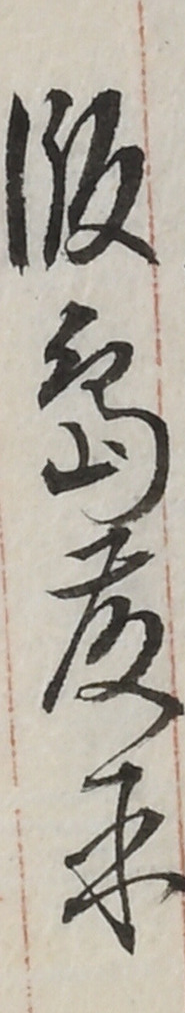飯島藤来

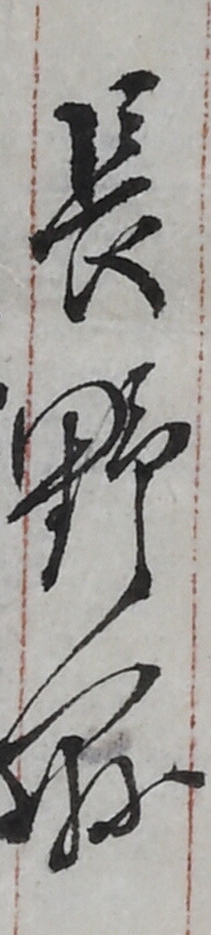長野県
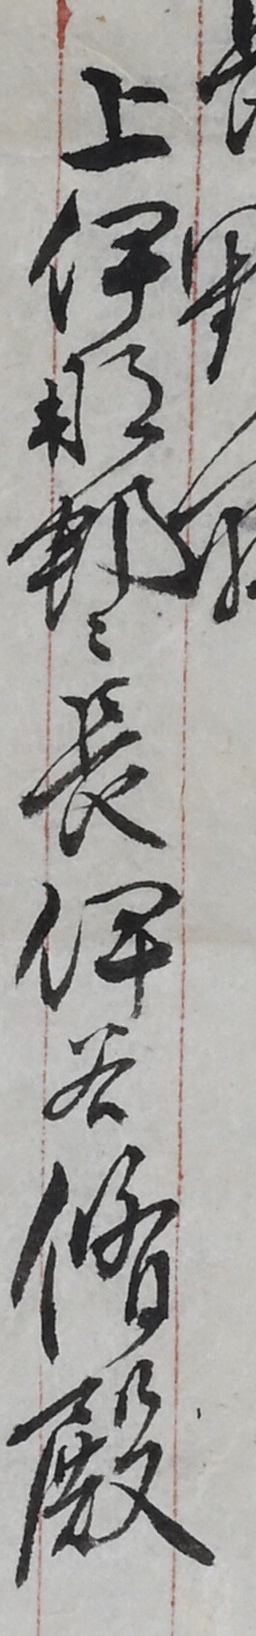上伊那郡々長伊藤修殿
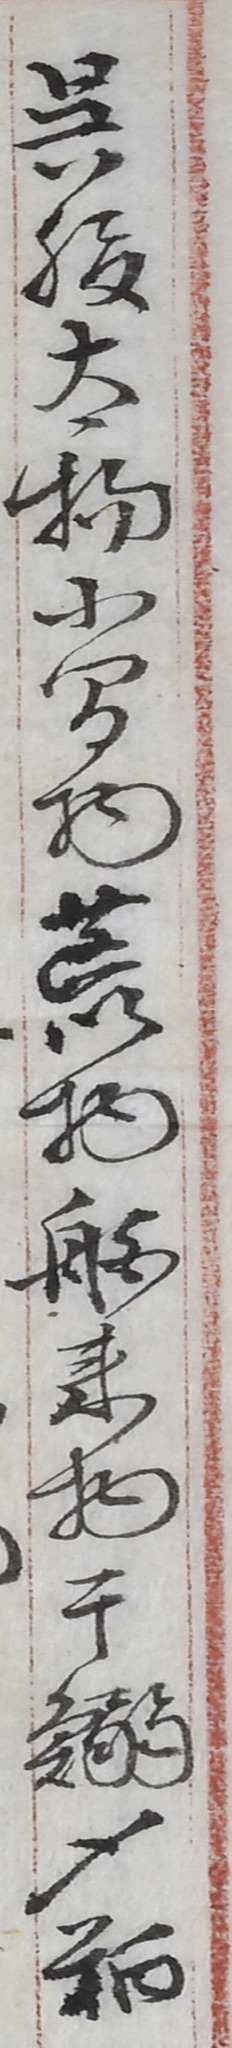呉服太物小間物荒物舶来物干鰯〆粕
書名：郡役所勤務中御用抜書
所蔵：伊那市立高遠町図書館・合同会社AMANE
